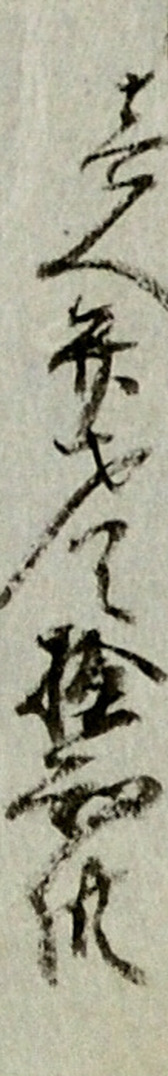壱人弁才天検知供
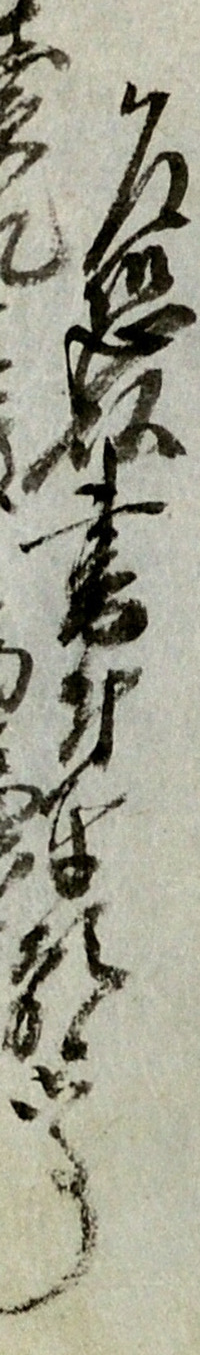乍恐以書付奉願候御事

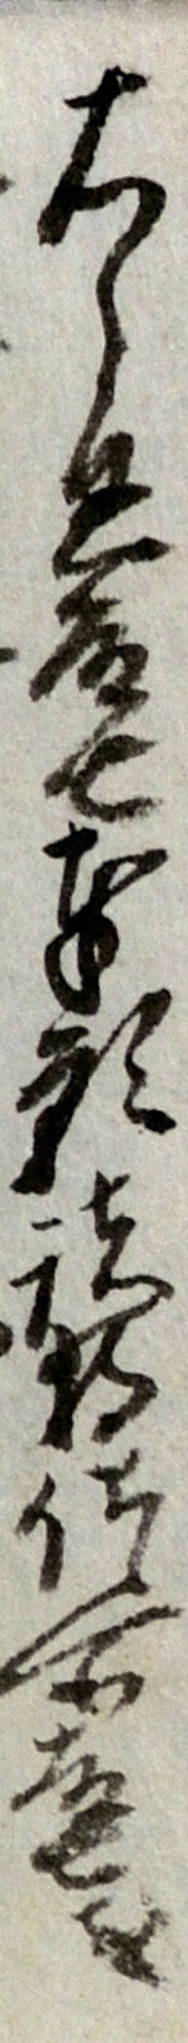右之通藤七奉願諸持仕候所藤七義
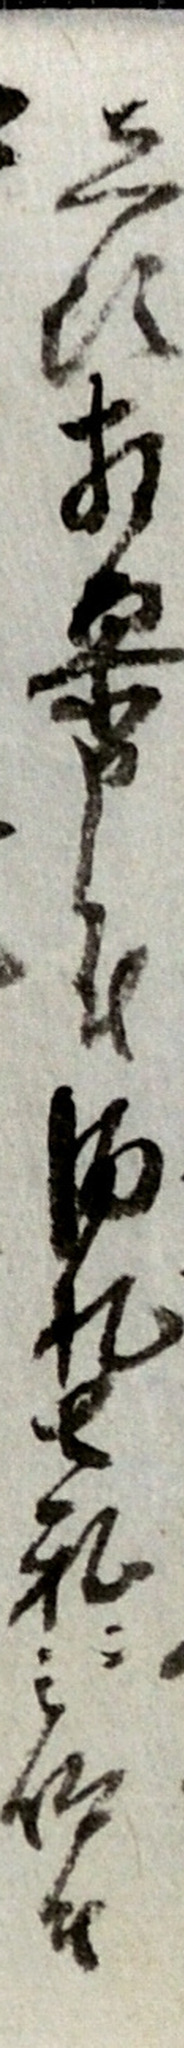先頃相果申候付酒札は私ニ被仰付
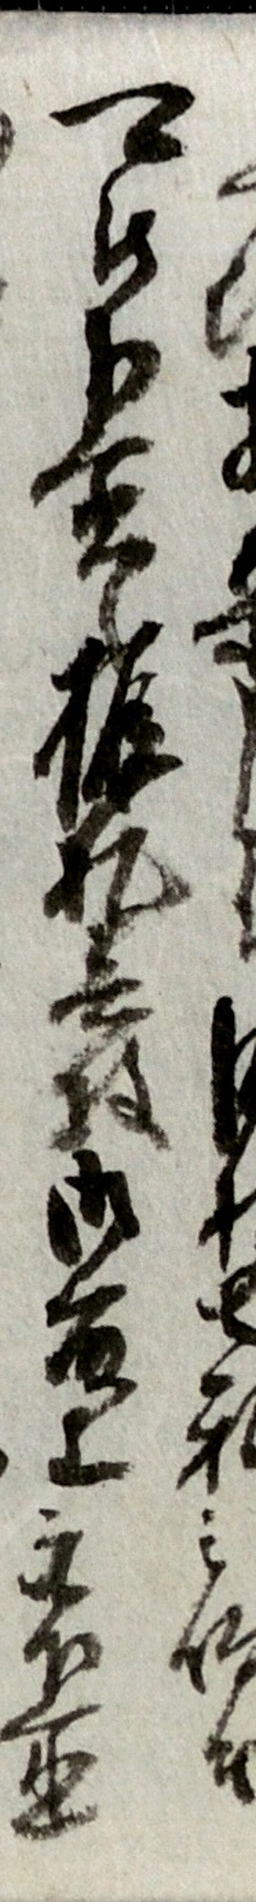可被下置候振札壱枚御取上被下置
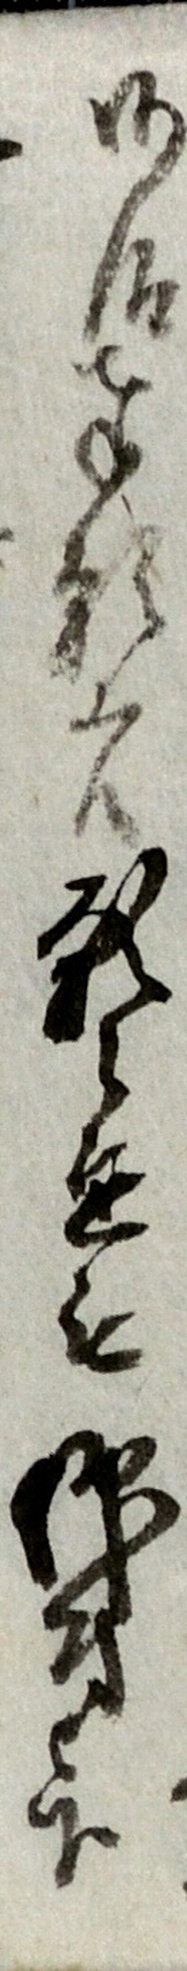候様奉願上候願之通被仰付被下
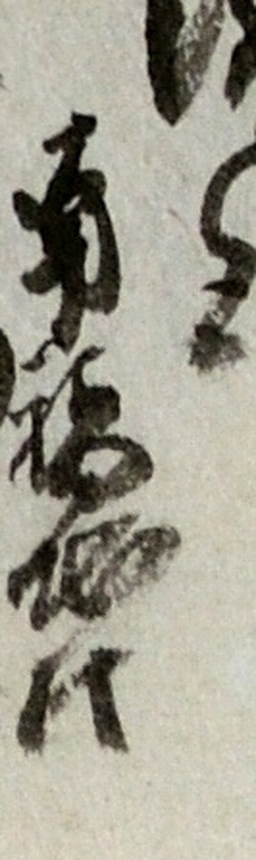南福地村
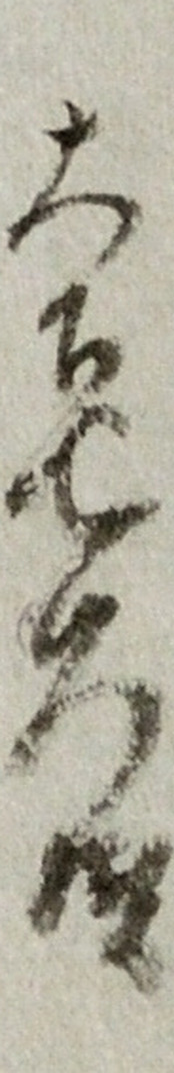大下喜右衛門殿
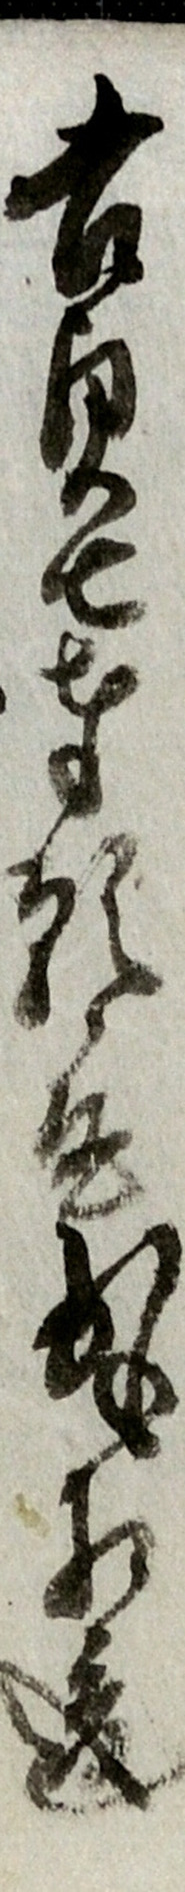右貞七奉願候通少も相違
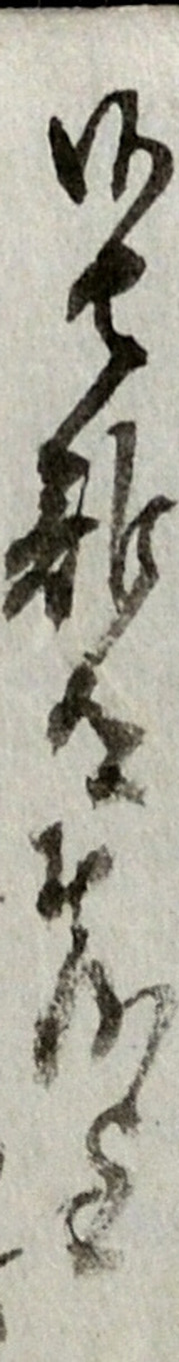候は難有奉存候以上
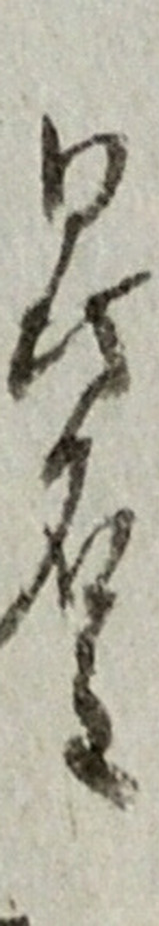同村名主
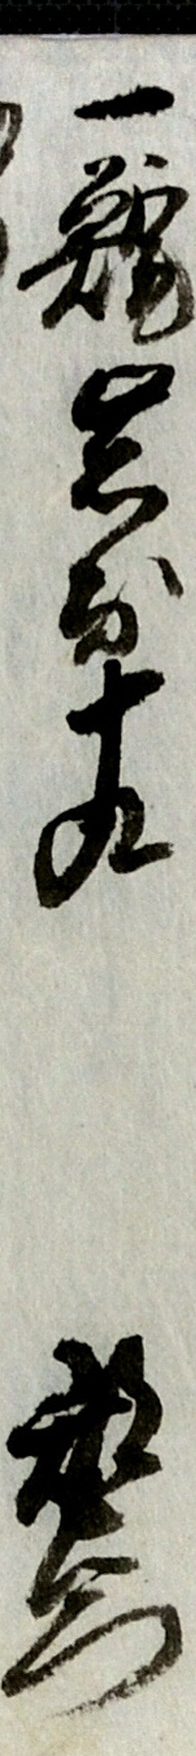一鯇岩な十九郡右衛門
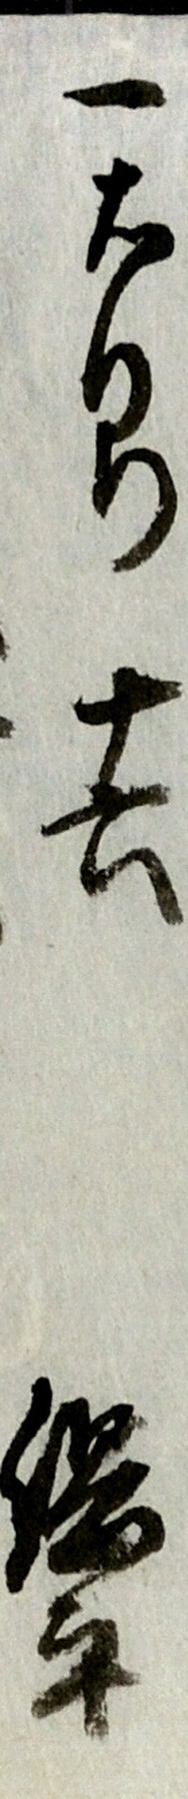一右同断十六総平
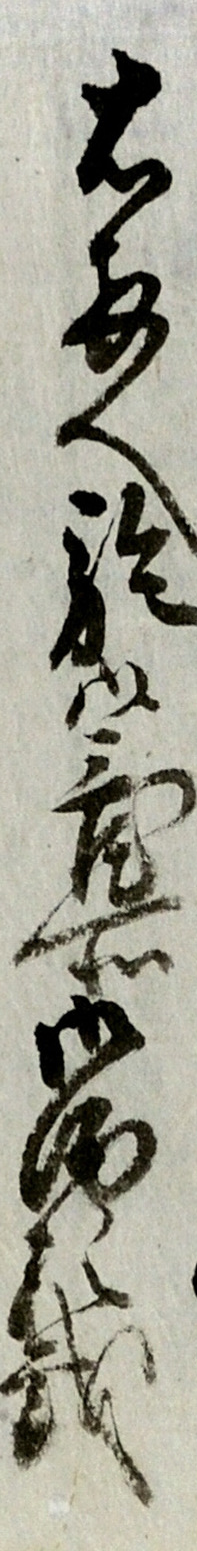右両人於御蔵所御酒頂戴
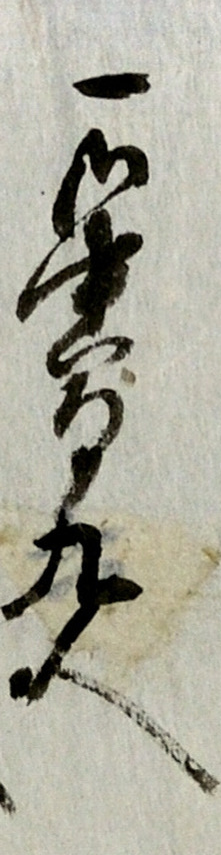一御中間九人
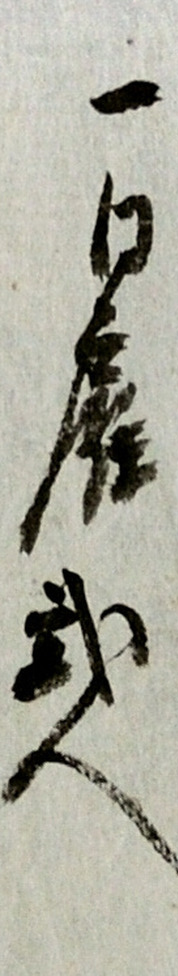一日雇弐人
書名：分一方諸事御用留帳
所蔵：伊那市立高遠町図書館・合同会社AMANE
